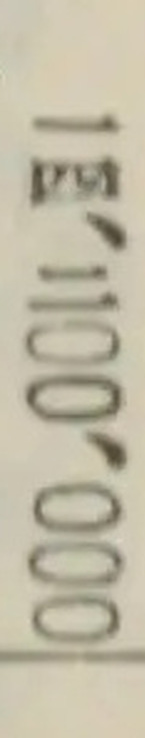計一四、〇〇〇、〇〇〇
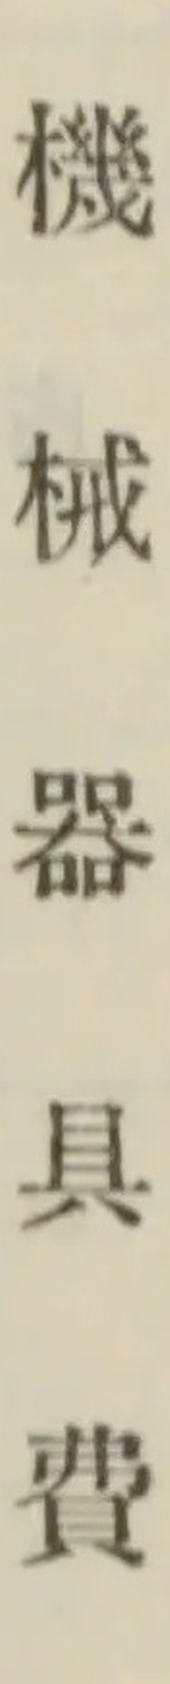機械器具費
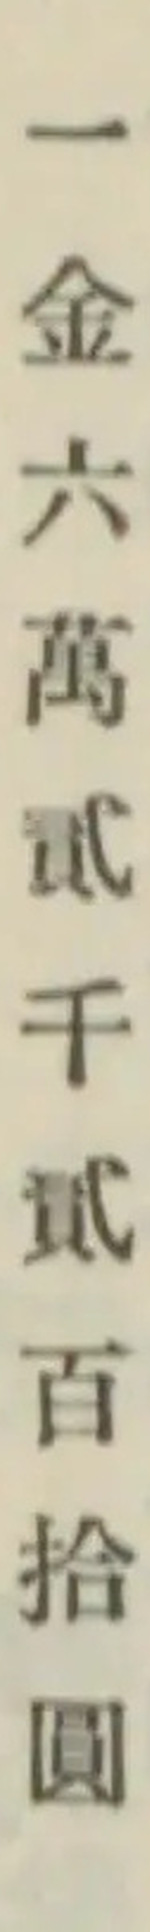一金六萬貳千貳百拾圓
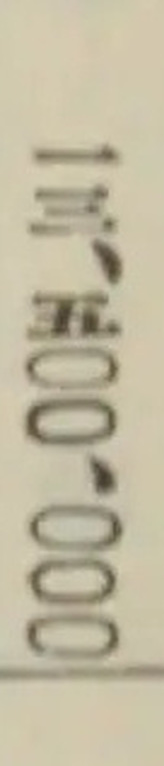計一四、〇〇〇、〇〇〇
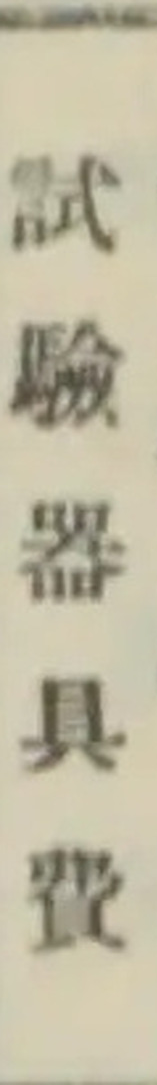機械器具費
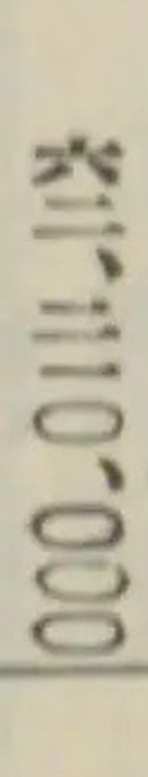計六二、二一〇、〇〇〇
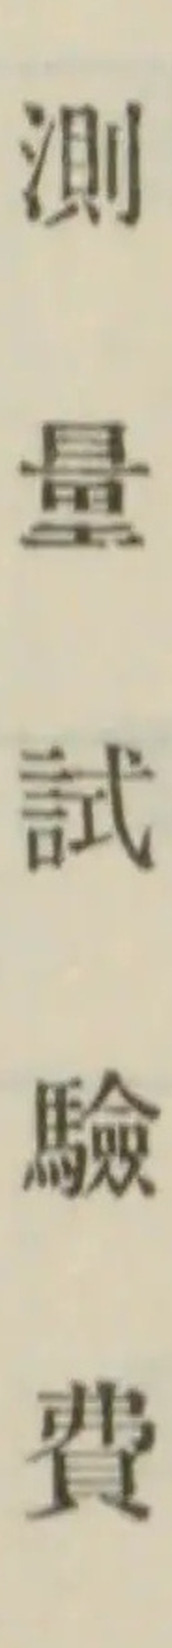測量試験費
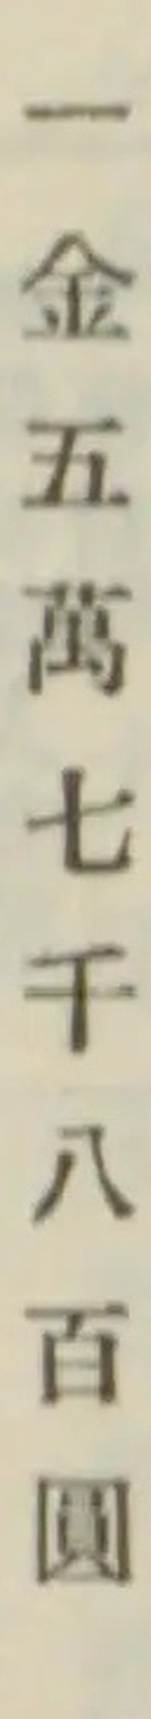一金五萬七千八百圓
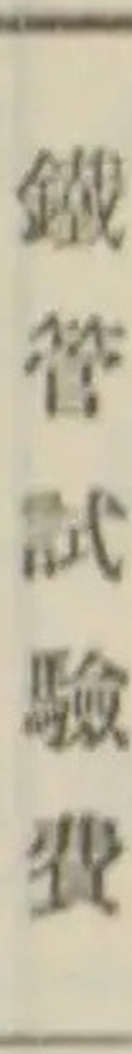測量試験費

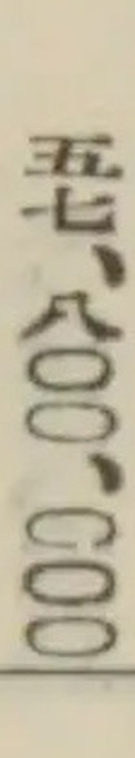計五七、八〇〇、〇〇〇
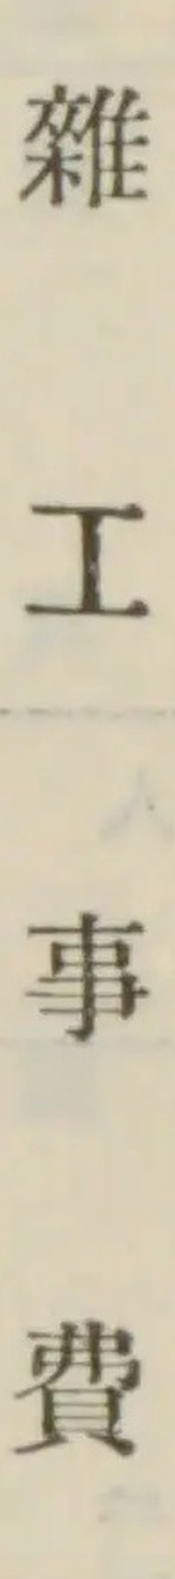雑工事費
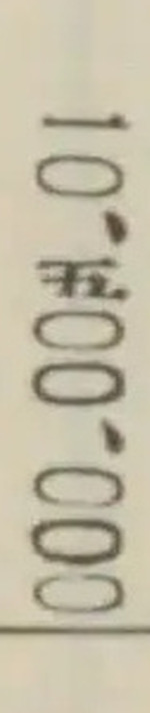雑費五〇〇、〇〇〇
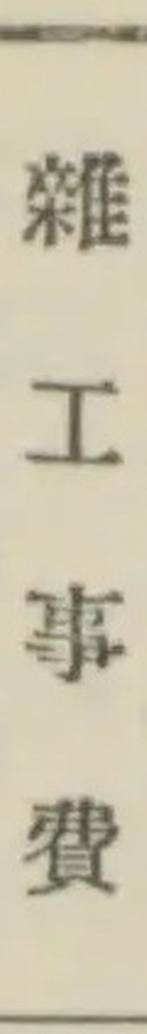雑工事費
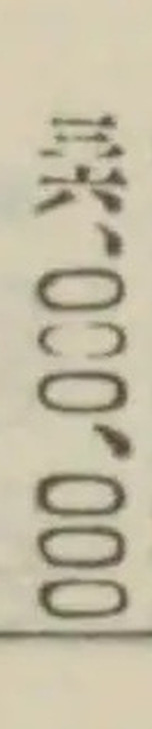計三六、〇〇〇、〇〇〇
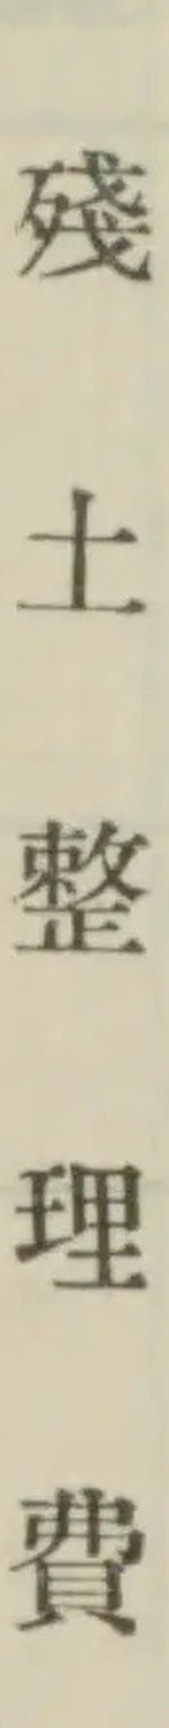残土整理費
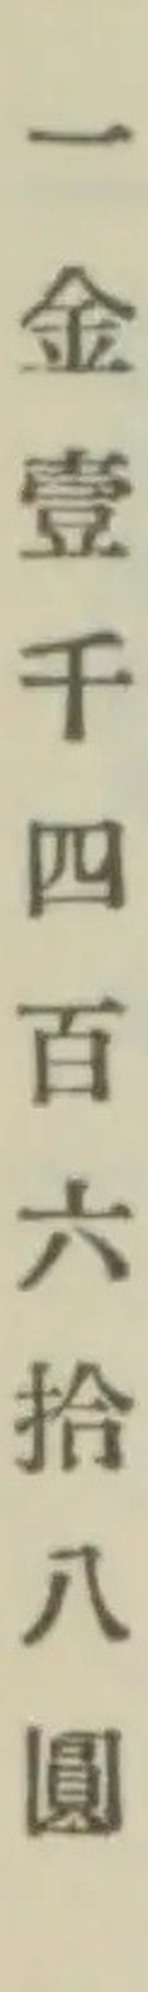一金壹千四百六拾八圓
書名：豊橋市水道誌
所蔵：国立国会図書館 National Diet Library, JAPAN
